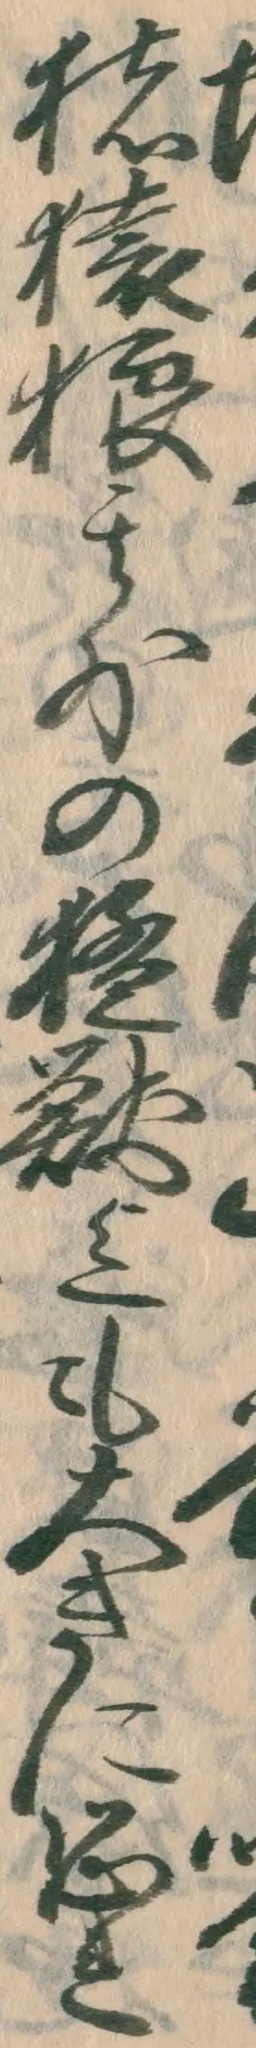猪猿狼其外の猛獣迄も大きに恐れ
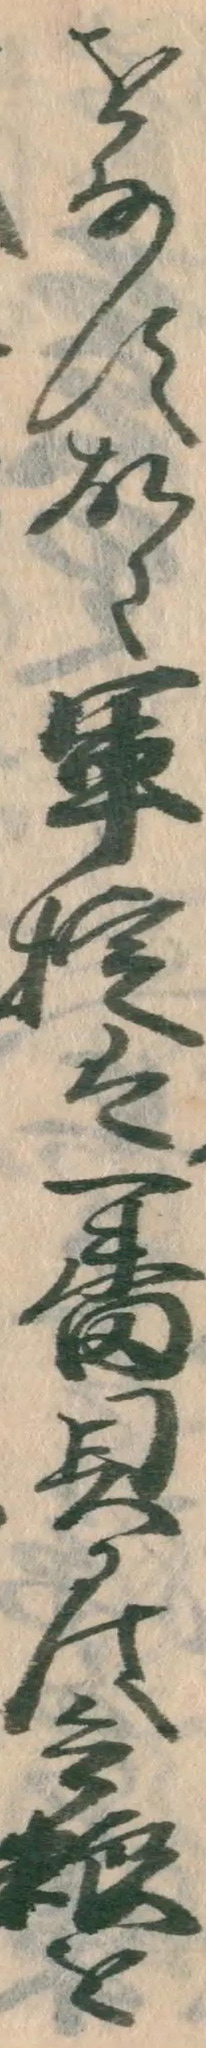をなす故に軍掟は一番貝には兵粮を
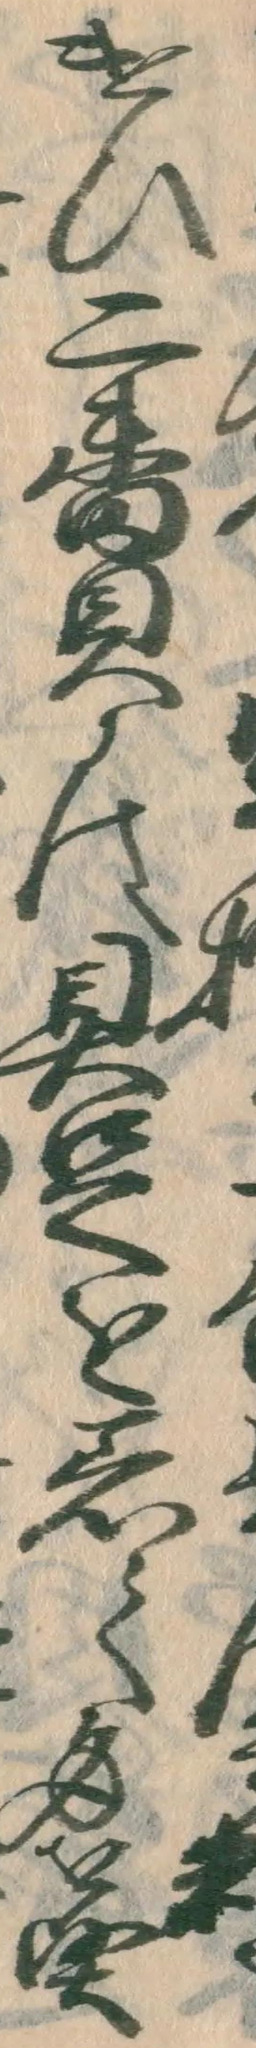遣ひ二番貝には具足を着て身を堅
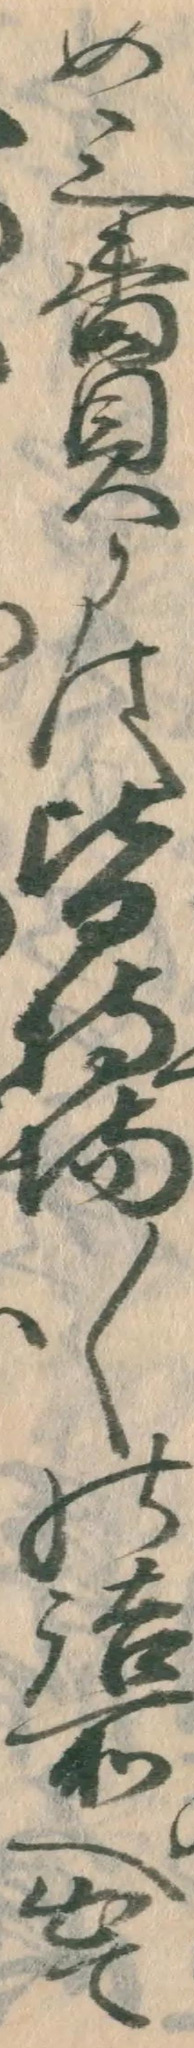め三番貝には皆持場〳〵の詰所へ出て
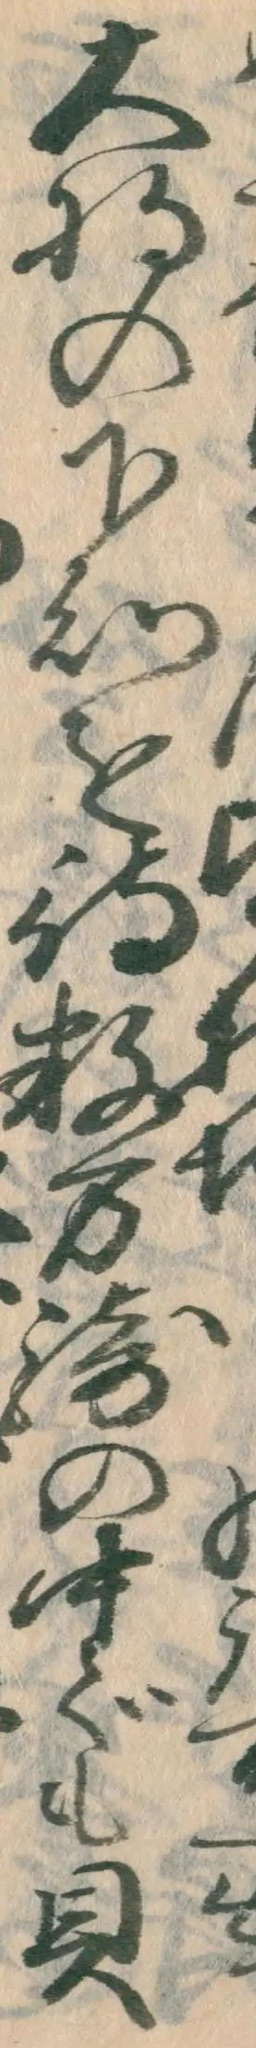大将の下知を待数万騎の中でも貝
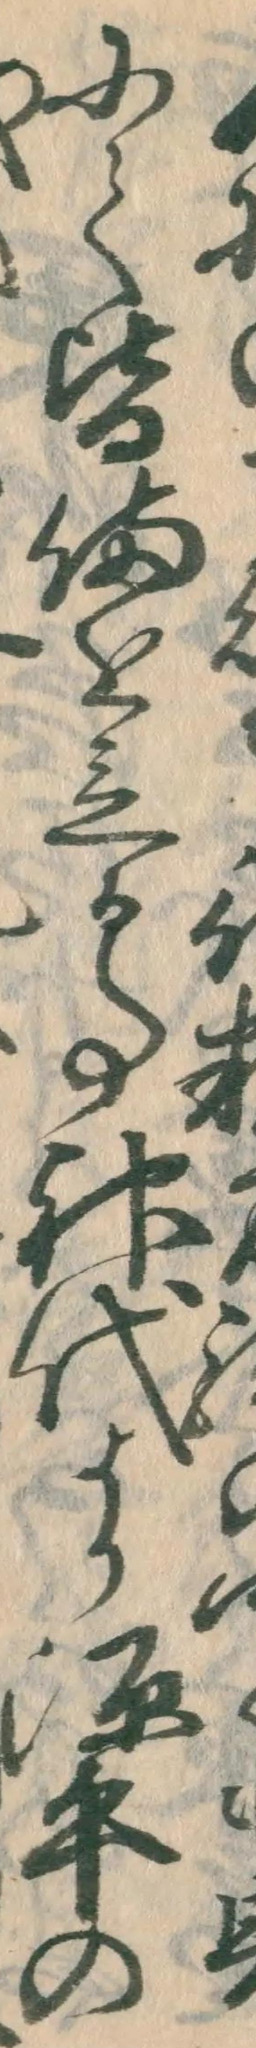にて皆備を立る事神代より源平の
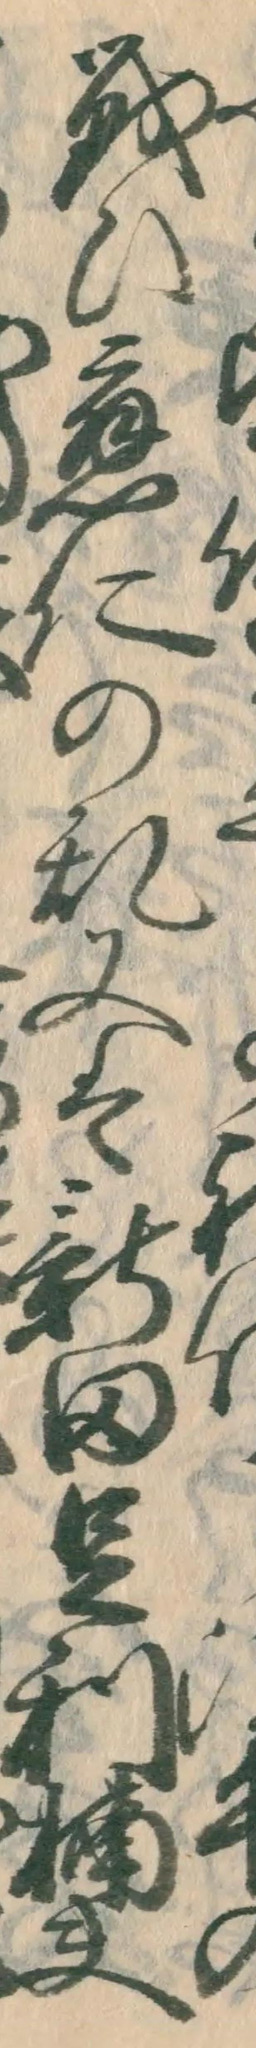戦ひ應仁の乱又は新田足利楠夫
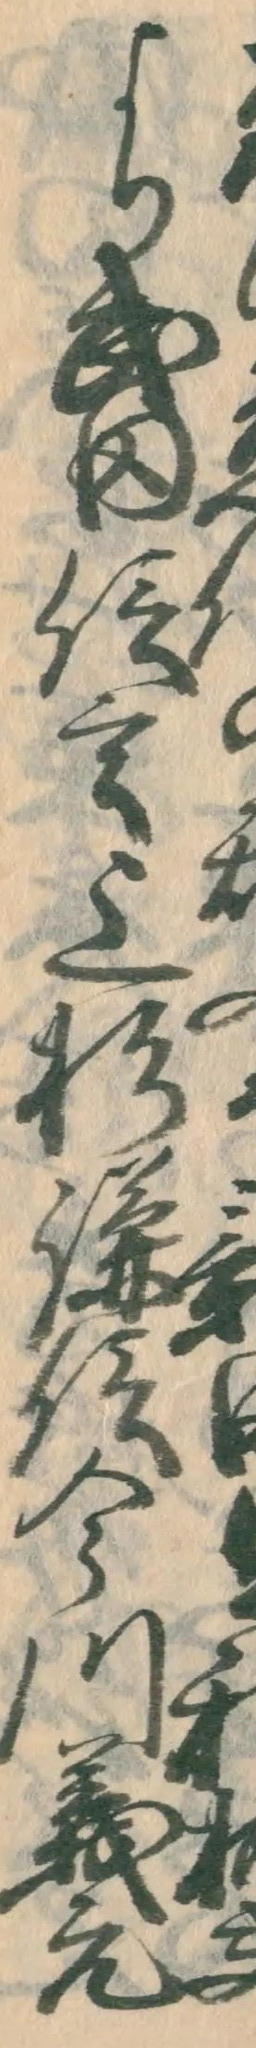より武田信玄上杉謙信今川義元

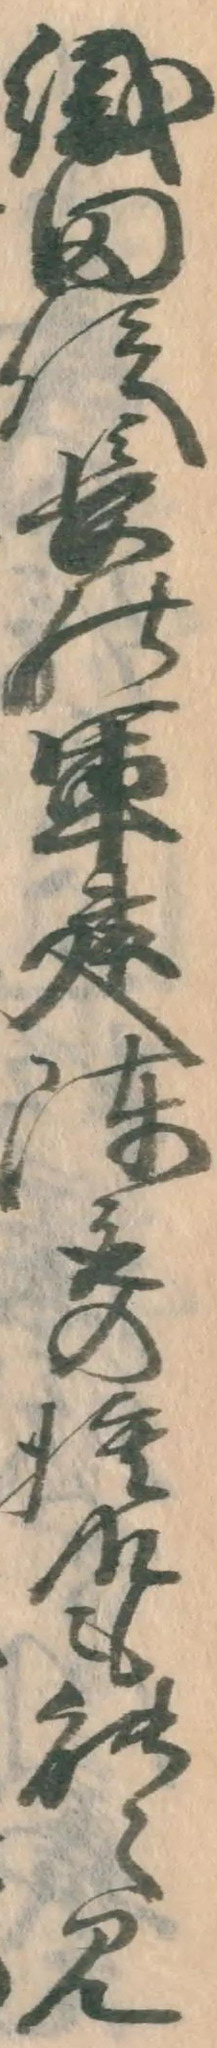織田信長の軍建陣取の模様も能々見
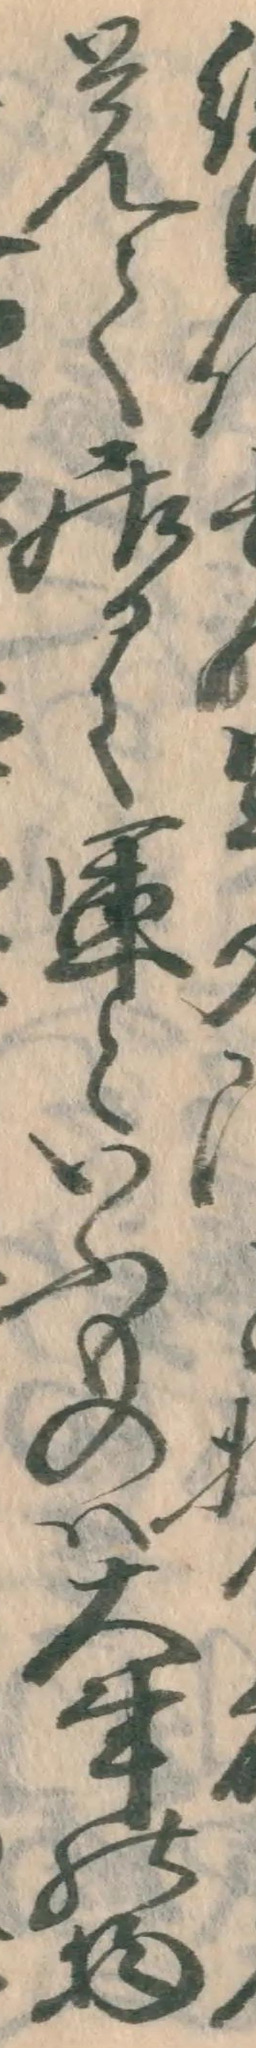覚て居るに軍といふものハ大事の物
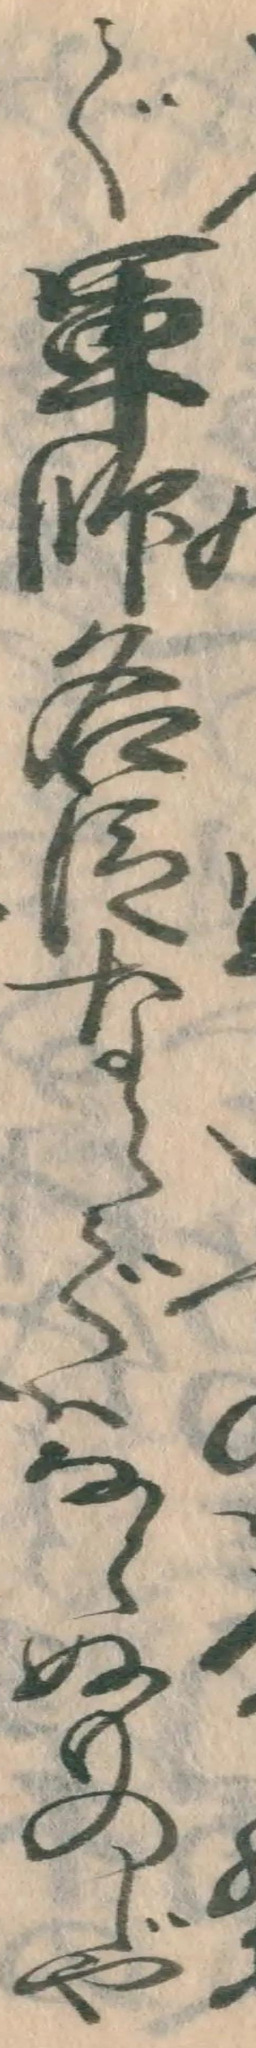で軍師名臣ならでハならぬものじや
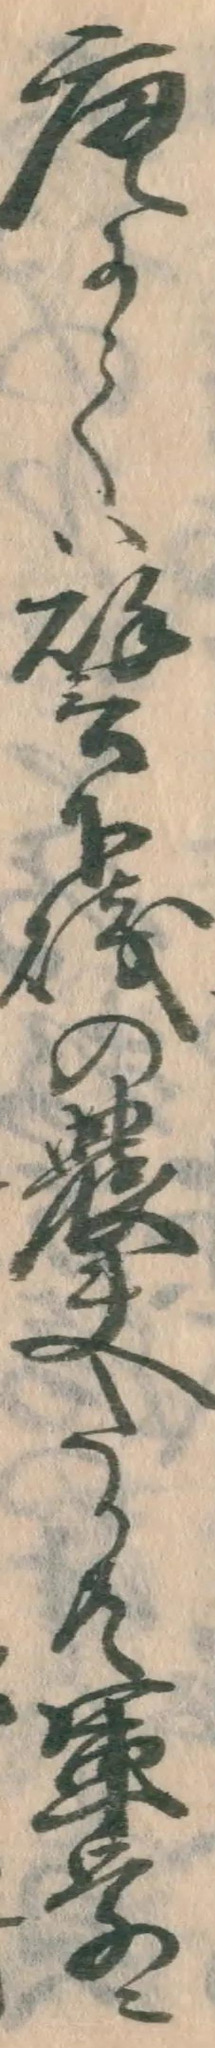唐にてハ譬下賤の農夫たり共軍学ニ
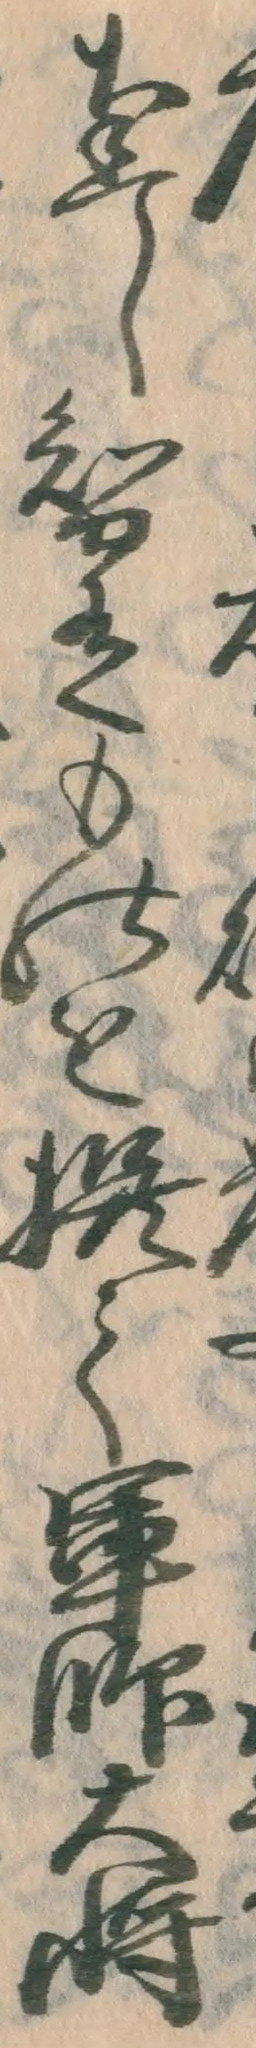達し智有ものを撰て軍師大将
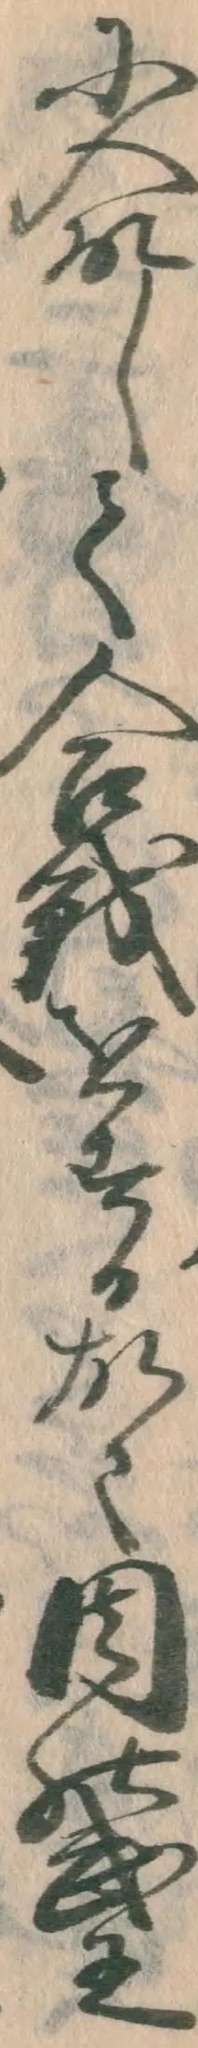に命して合戦をする故に周の武王
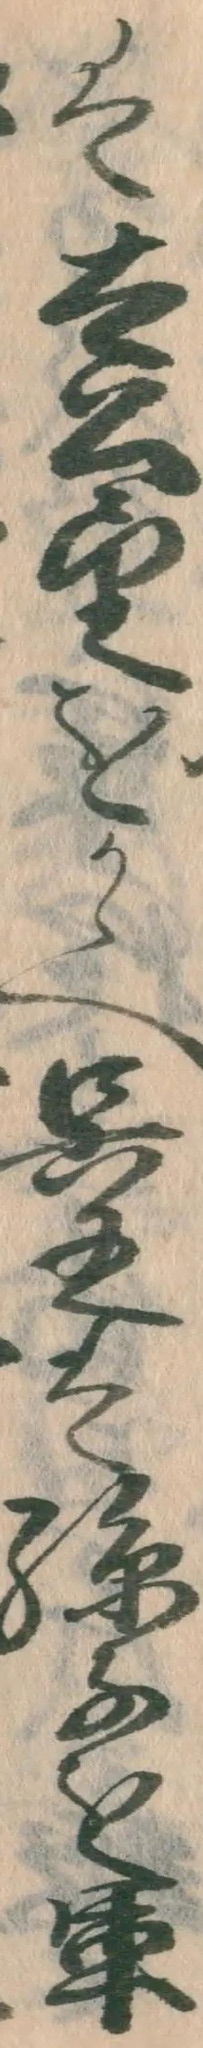は太公望をかゝへ呉王は孫子を軍
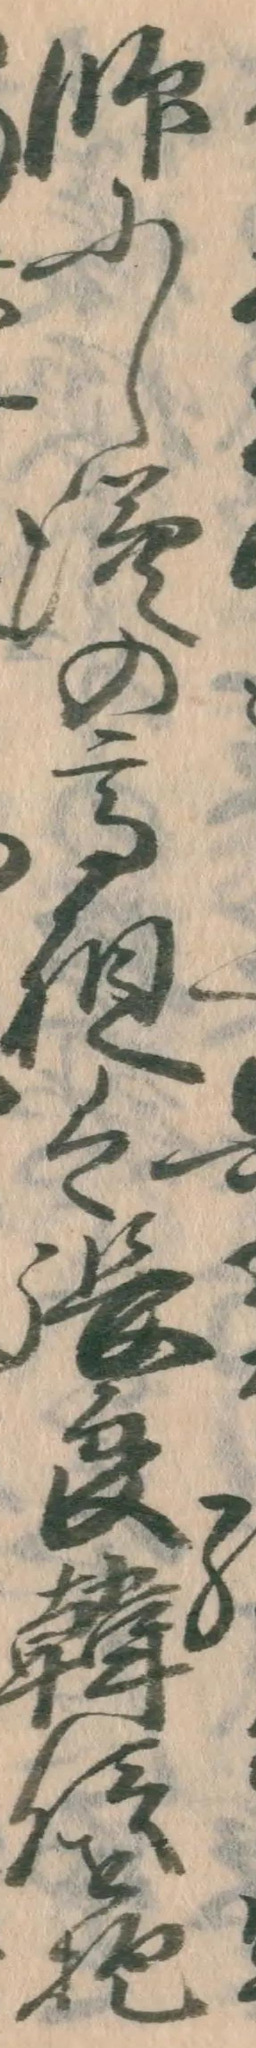師にし漢の高祖は張良韓信を抱
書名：麗斎叢書. 20
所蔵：国立国会図書館 National Diet Library, JAPAN
